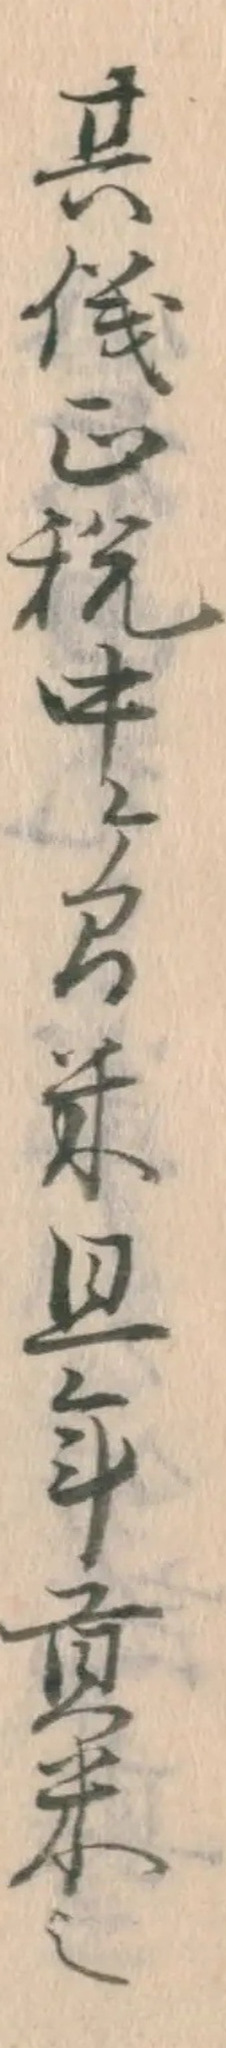其儀正税中ケ間米旦年貢米之
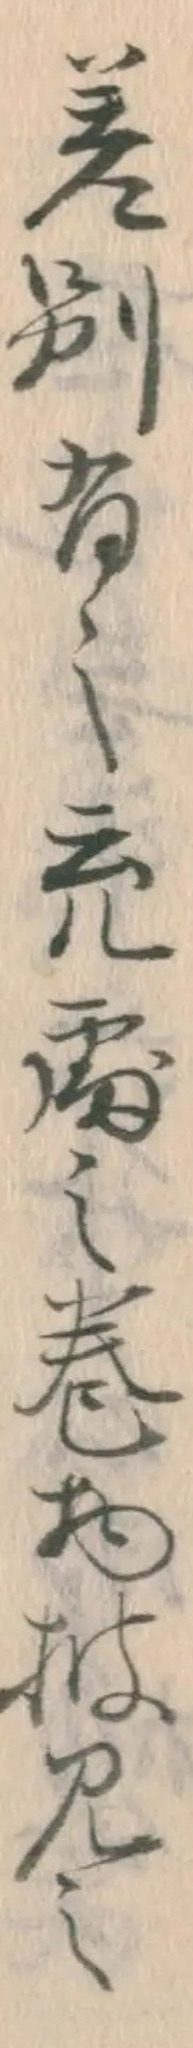差別有之充處之巻物披見之
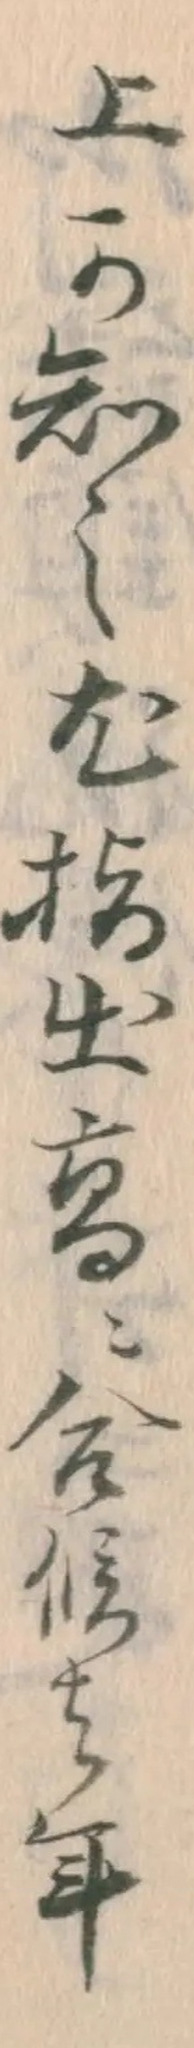上可知之尤指出高ニ合候は年
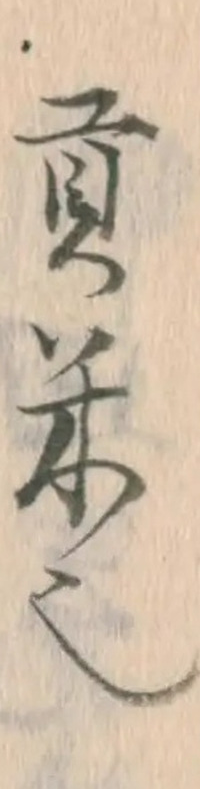貢米也
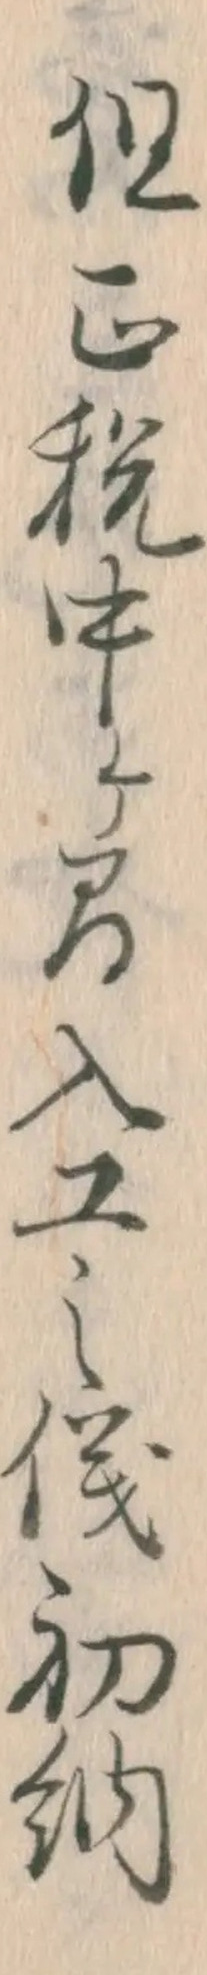但正税中ケ間人工之儀初納
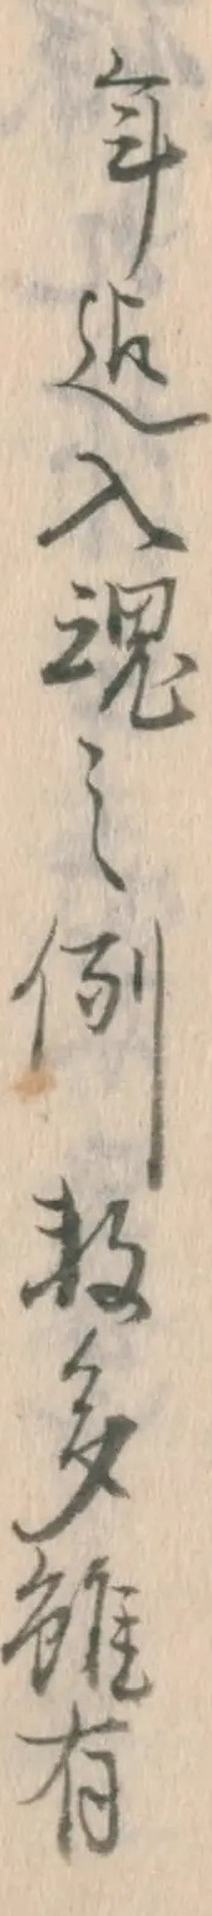年迄入魂之例数多雖有
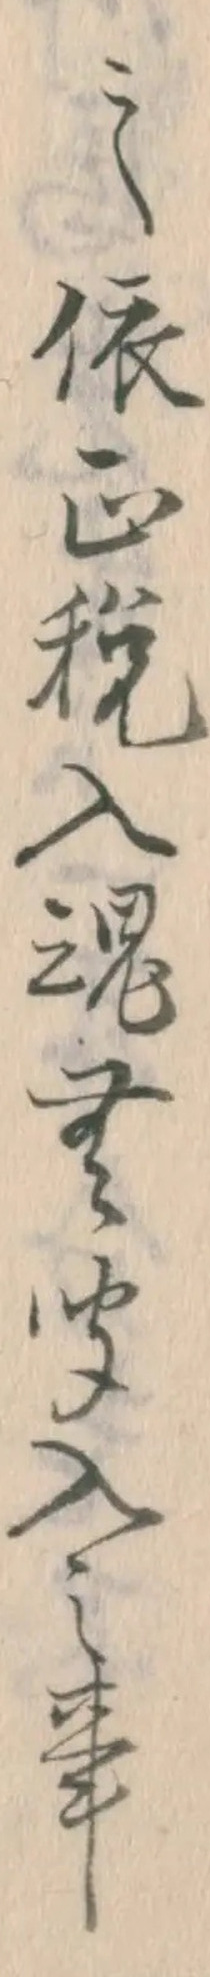之依正税入魂無聞入之事
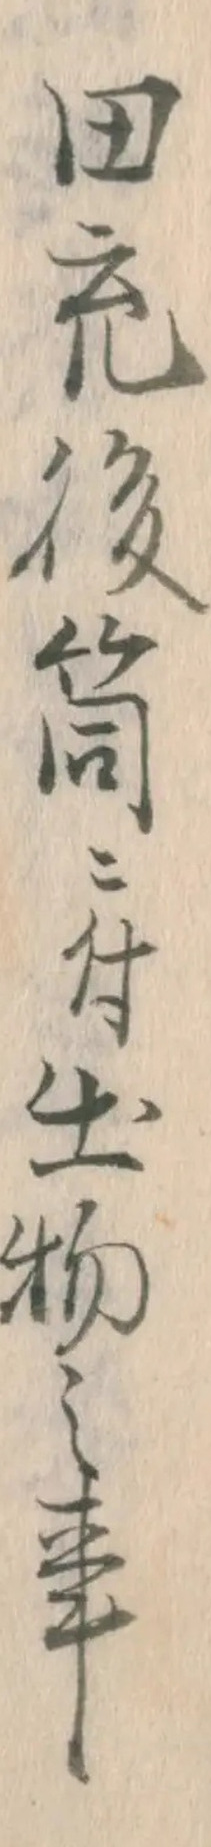田充後筒ニ付出物之事
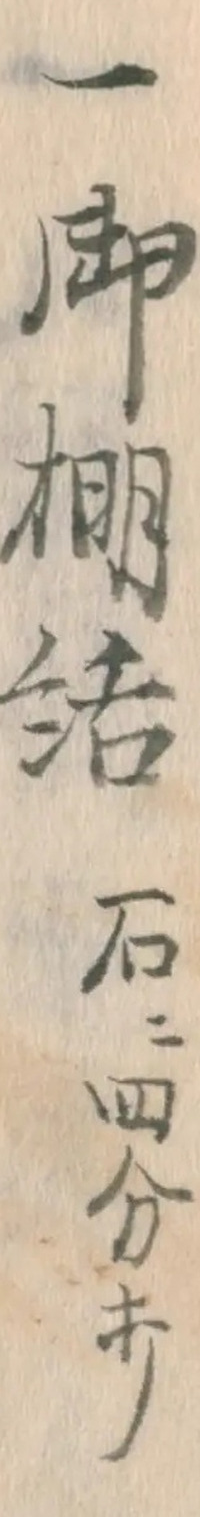一御棚結石二四分打
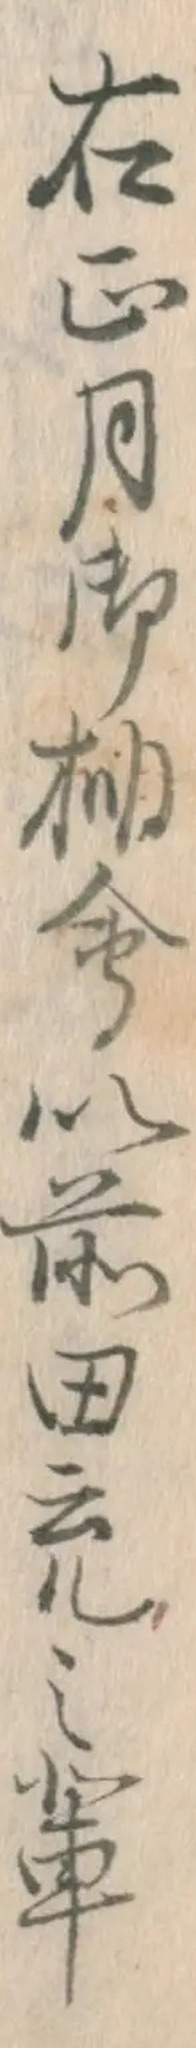右正月御棚會以前田充之輩
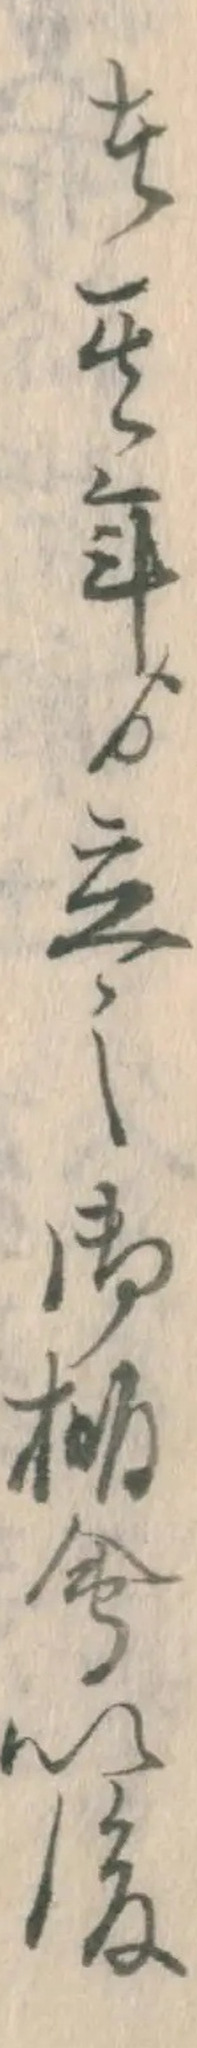は其年ゟ立之御棚會以後
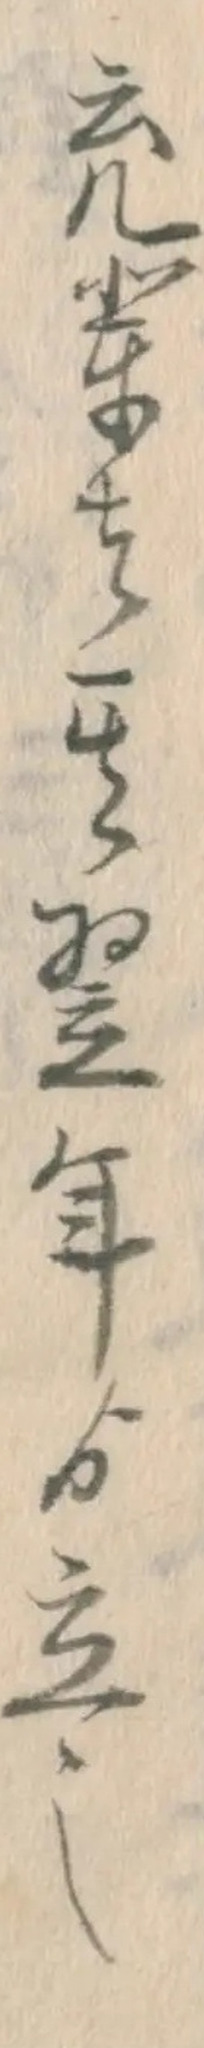充輩は其翌年ゟ立也
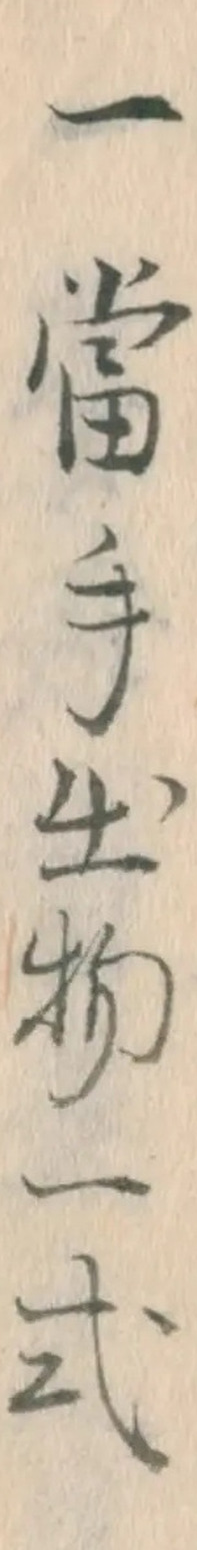一當手出物一式

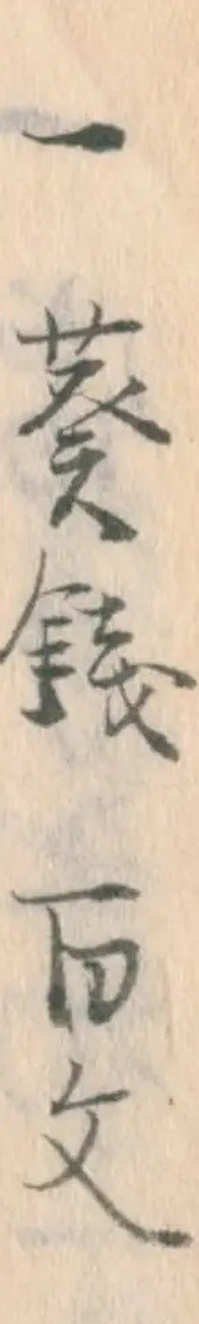一葵銭百文
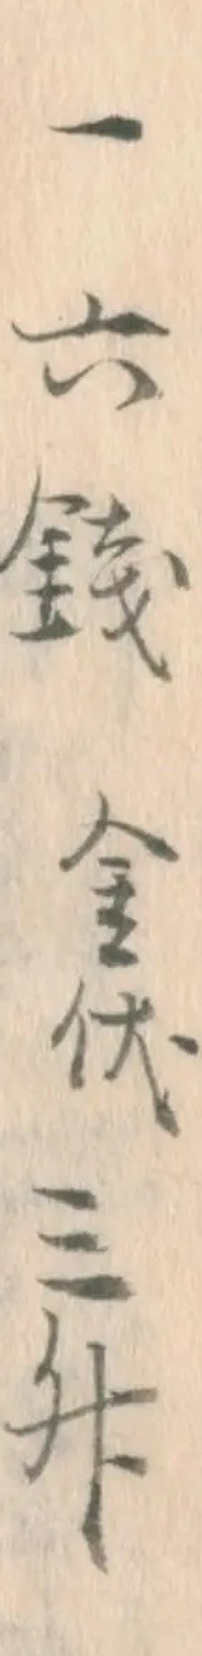一六銭金伏三升
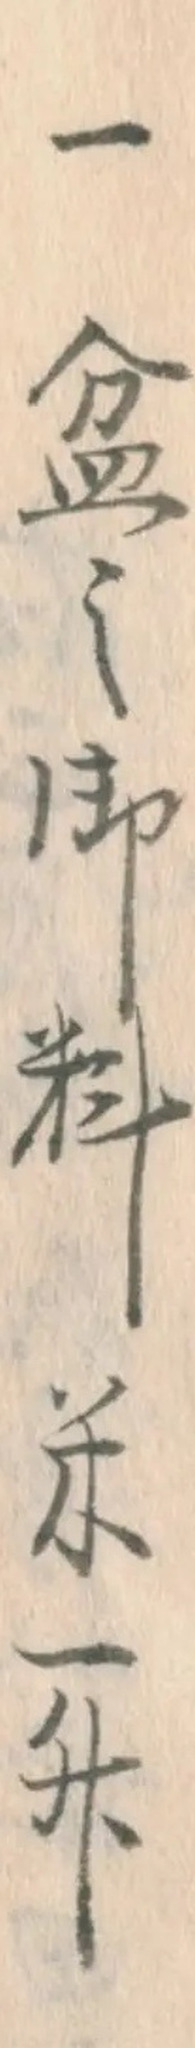一盆之御料米一升
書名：賀茂社記録. 第81冊
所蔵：国立国会図書館 National Diet Library, JAPAN
